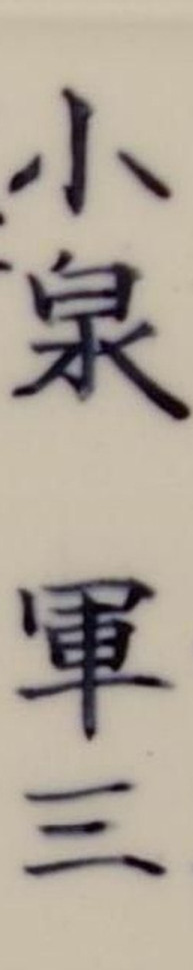小泉軍三
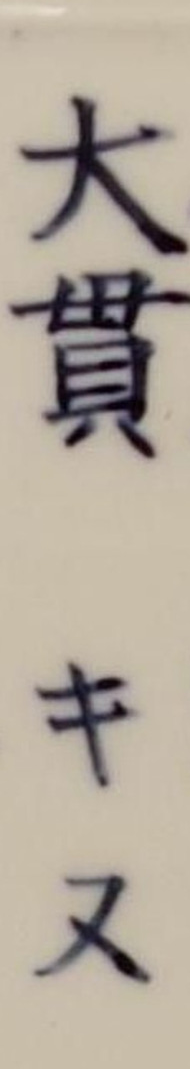大貫キヌ
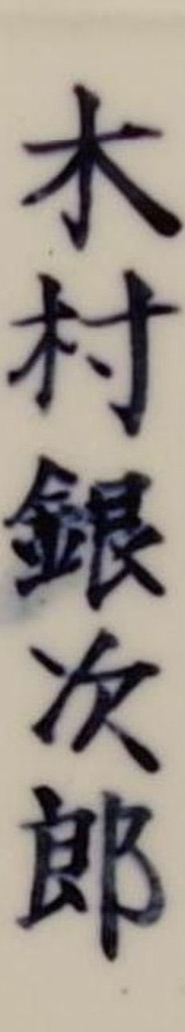木村銀次郎
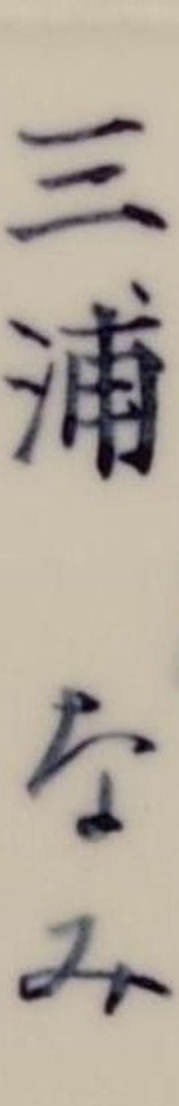三浦なみ
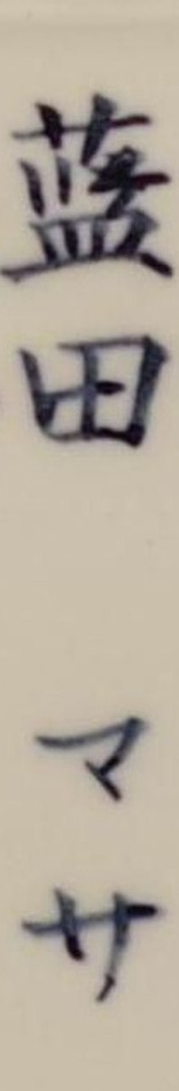藍田マサ
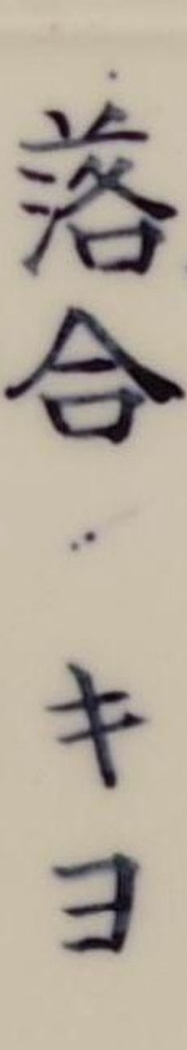落合キヨ
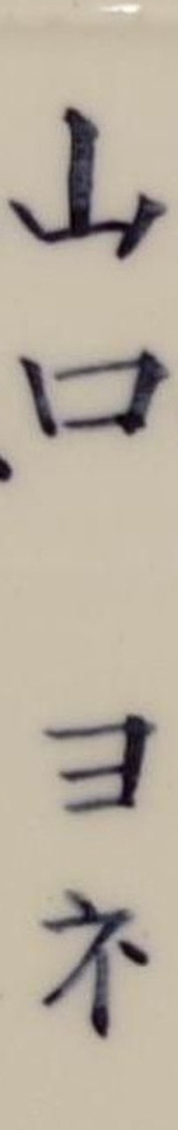山口ヨネ
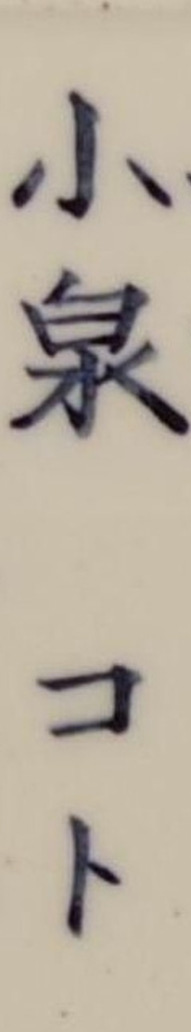小泉コト
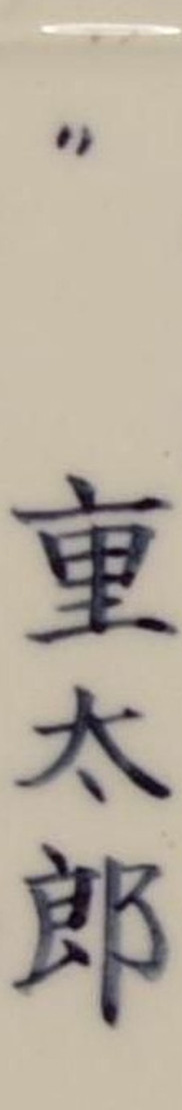重太郎
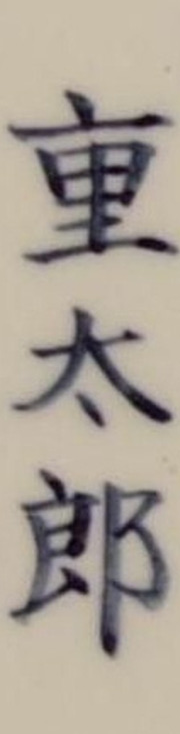重太郎
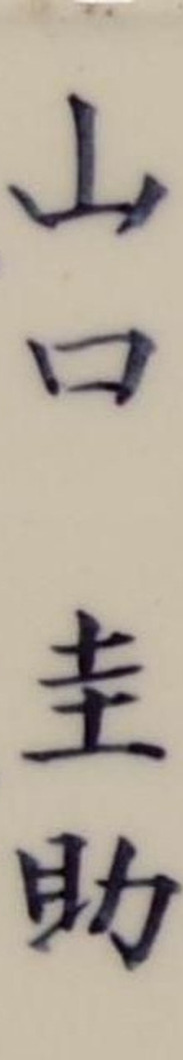山口圭助
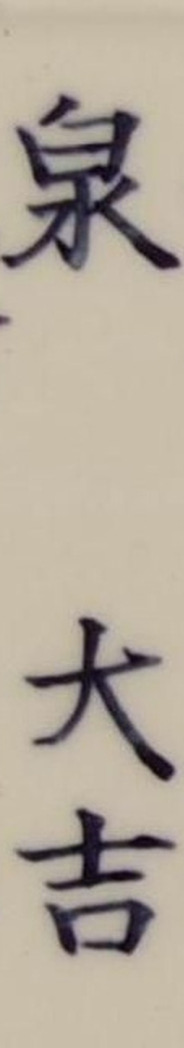泉大吉
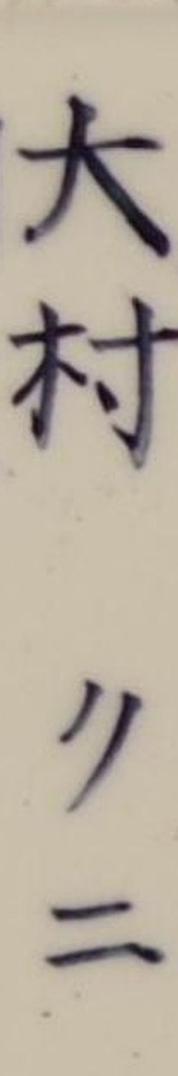大村クニ
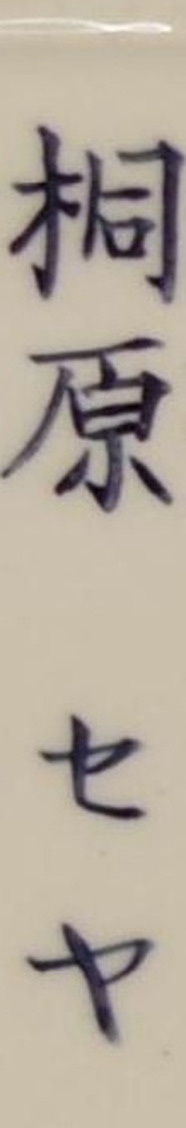桐原セヤ
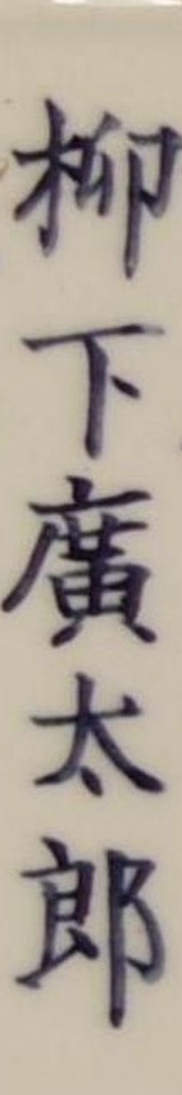柳下廣太郎
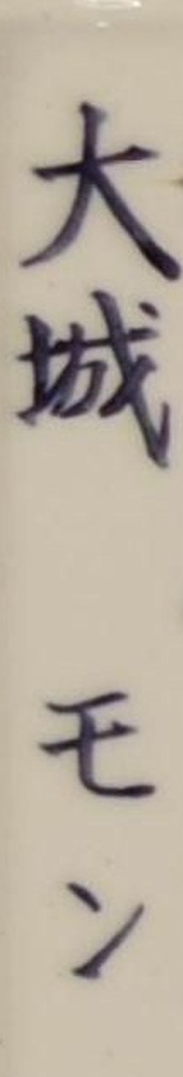大城モン
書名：M~S
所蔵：高野山金剛峯寺
